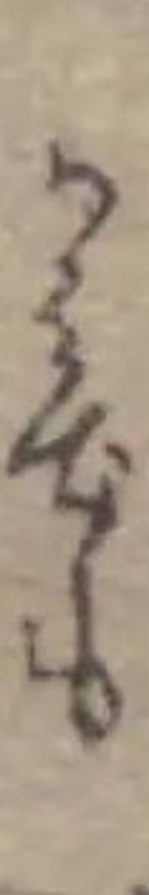かみでも
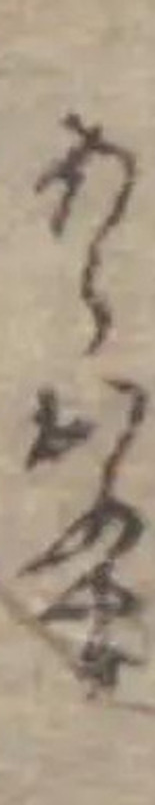あらおふす
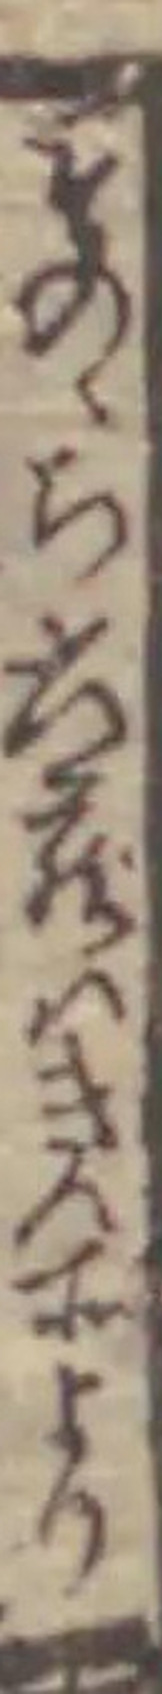そのゝち六蔵はきん所より
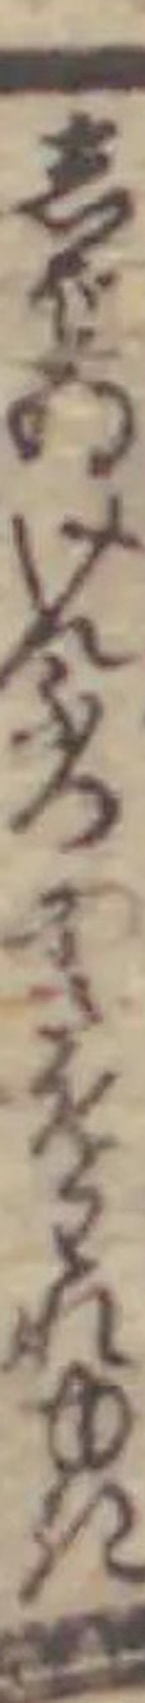しばゐけんふつにさそわれゆき
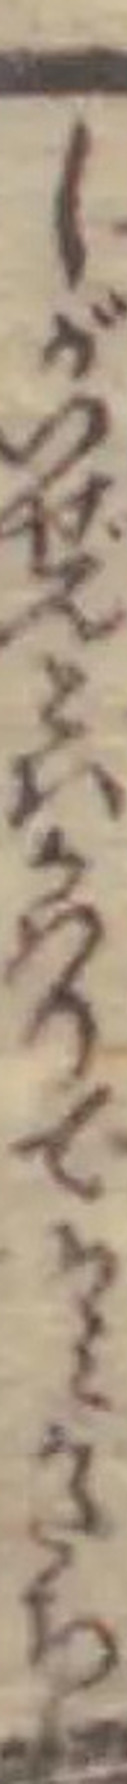しがいぜんとはかはりてかみかたち
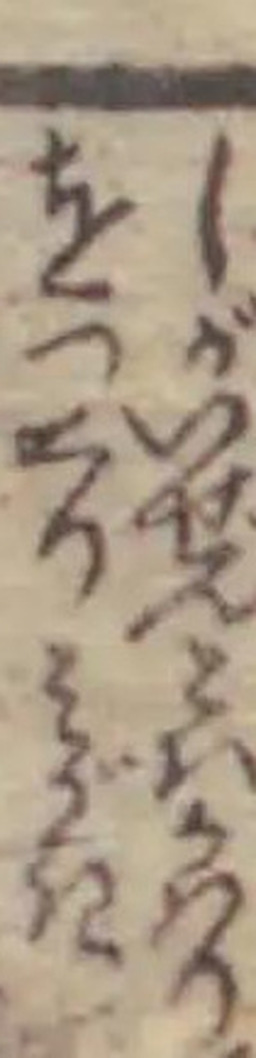をつくりみがき
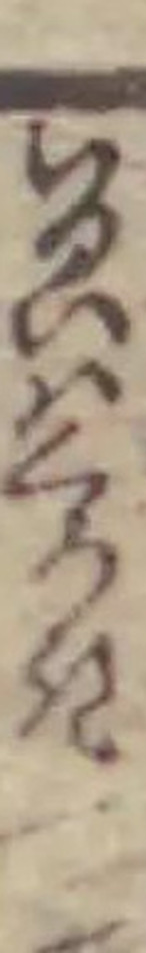いるいはくろき
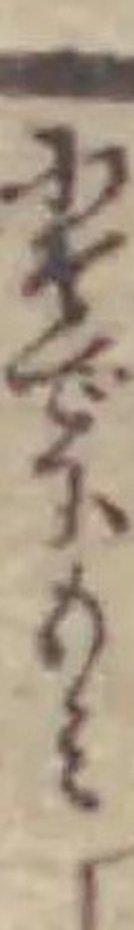にそでにもみ
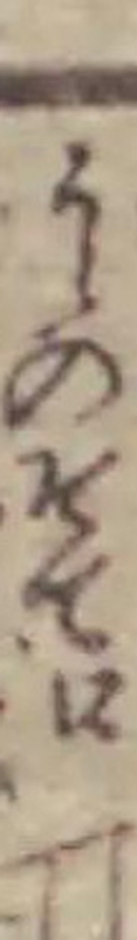うらのそて口
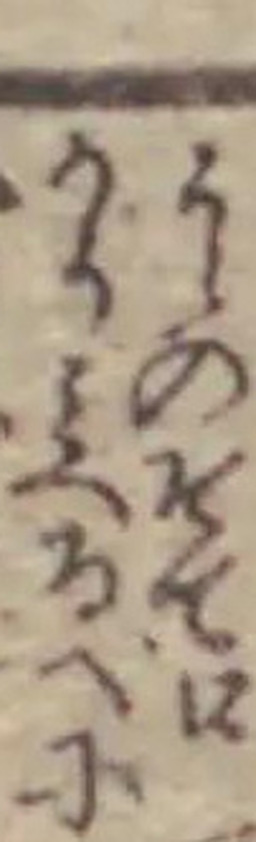からみへるへに
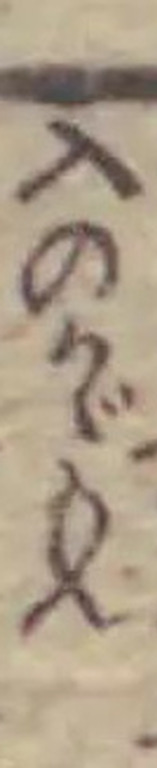入のかゞもん
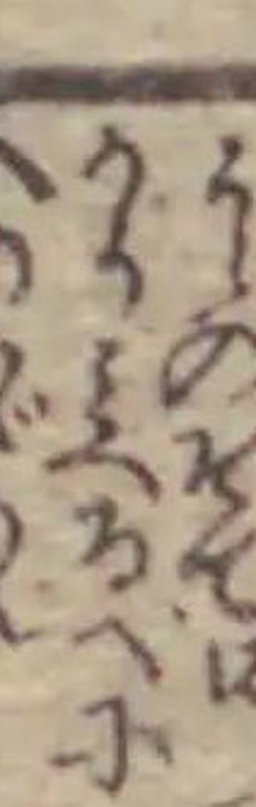からみへるへに
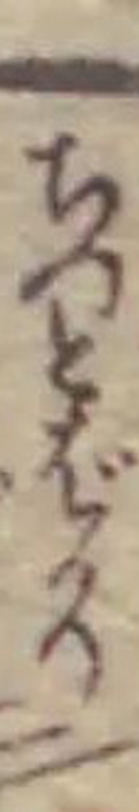ちつとばかり
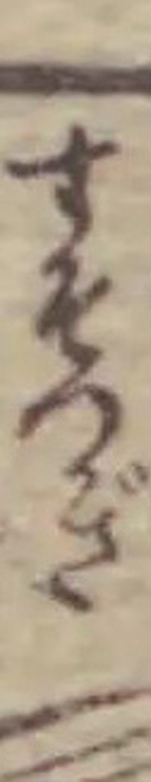すそつぎ
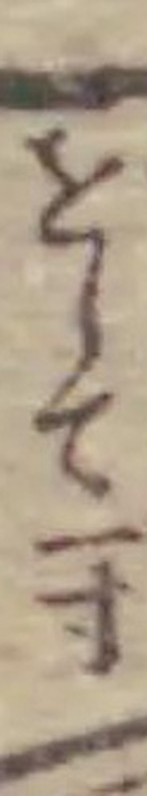をして一寸
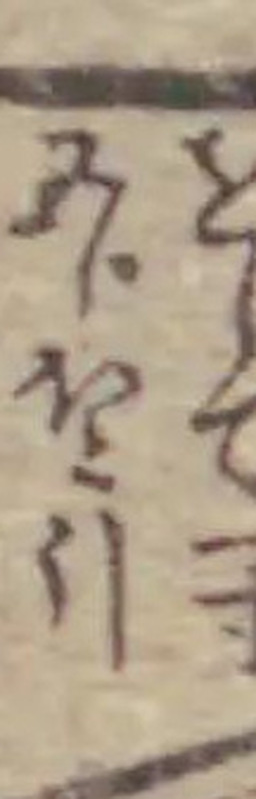五分ほと引
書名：飛た間違矢口噂 2巻
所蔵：国立国会図書館 National Diet Library, JAPAN
